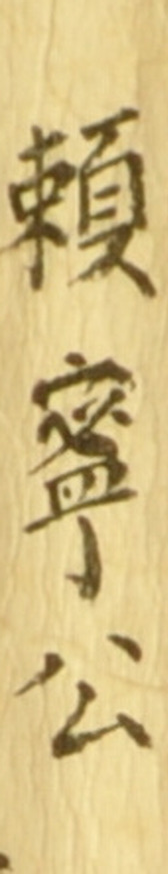頼寧公

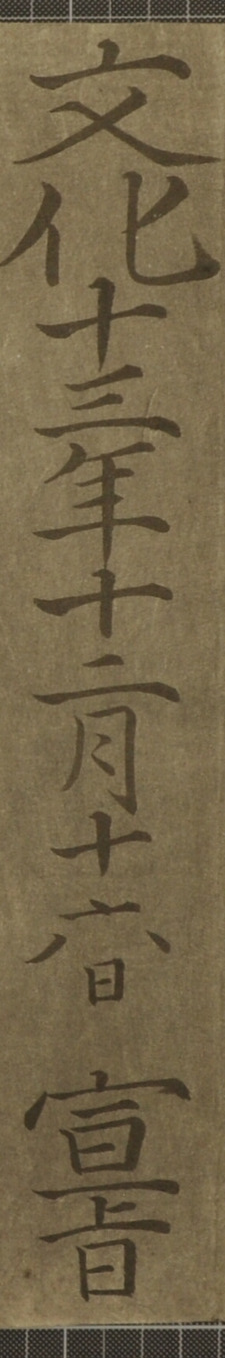文化十三年十二月十六日宣旨
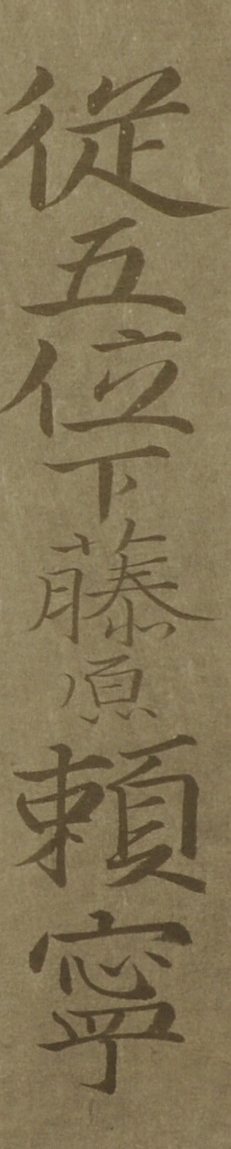従五位下藤原頼寧
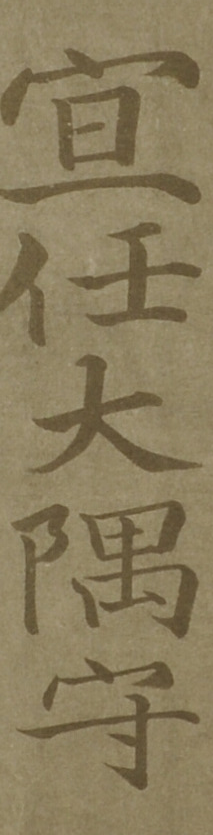宜任大隅守

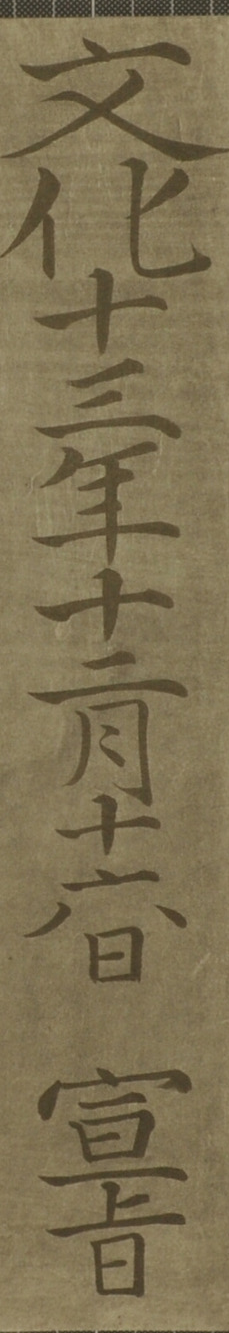文化十三年十二月十六日宣旨
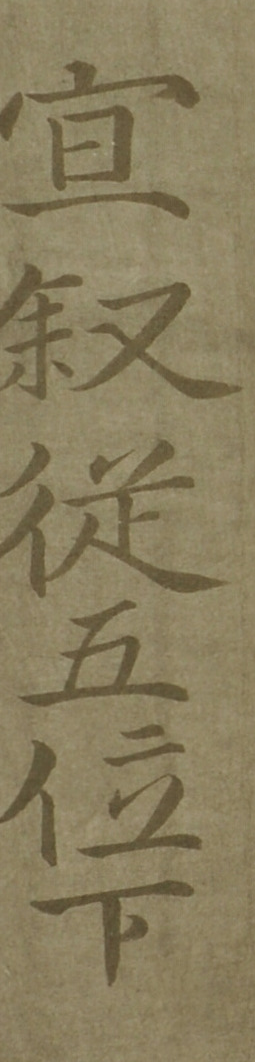宜叙従五位下
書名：口宣案・宣旨・位記
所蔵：伊那市立高遠町図書館・合同会社AMANE
